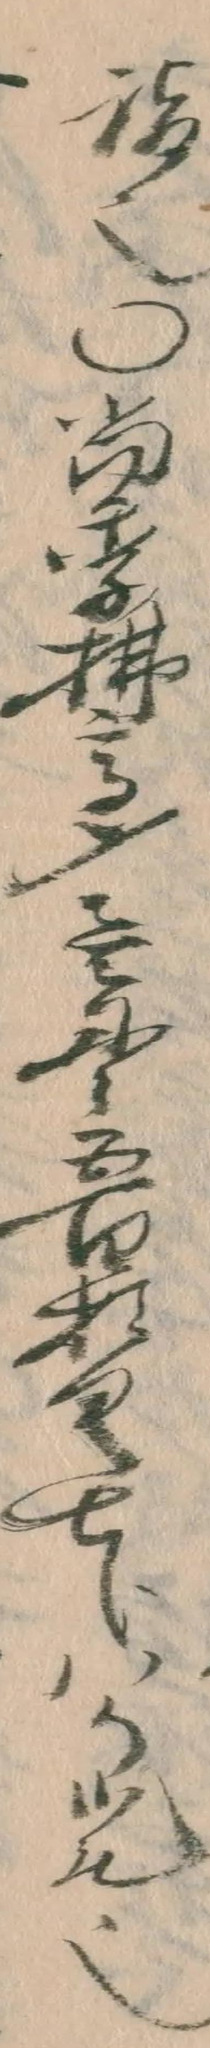詣也○當季払高〆壱貫五百拾匁七分八り弐毛也
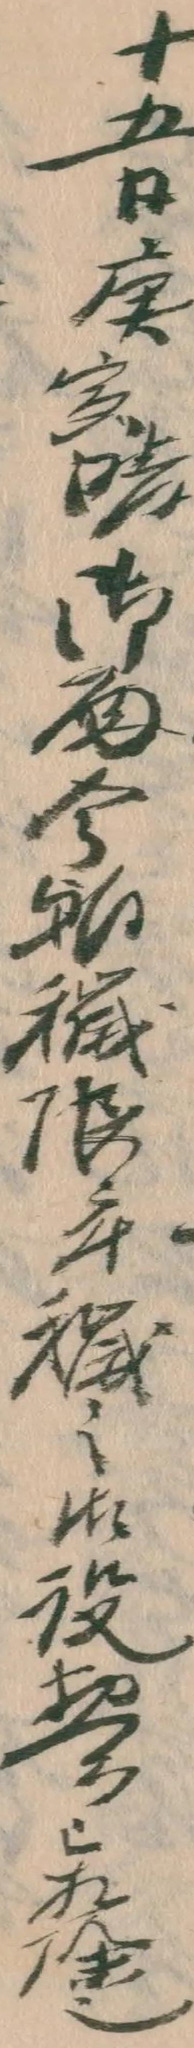十五日庚寅晴御殿今朝穢限ニ付穢之御設惣而被相除也
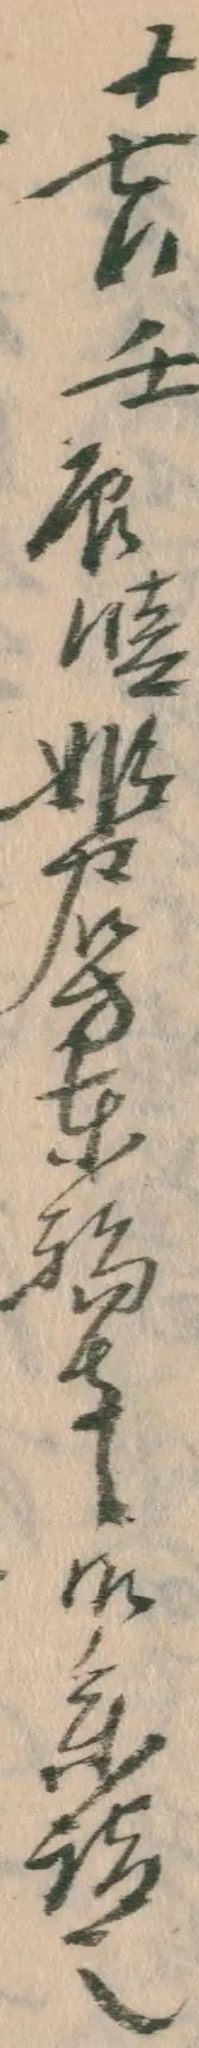十七日壬辰晴姫君方東福寺へ御参詣也
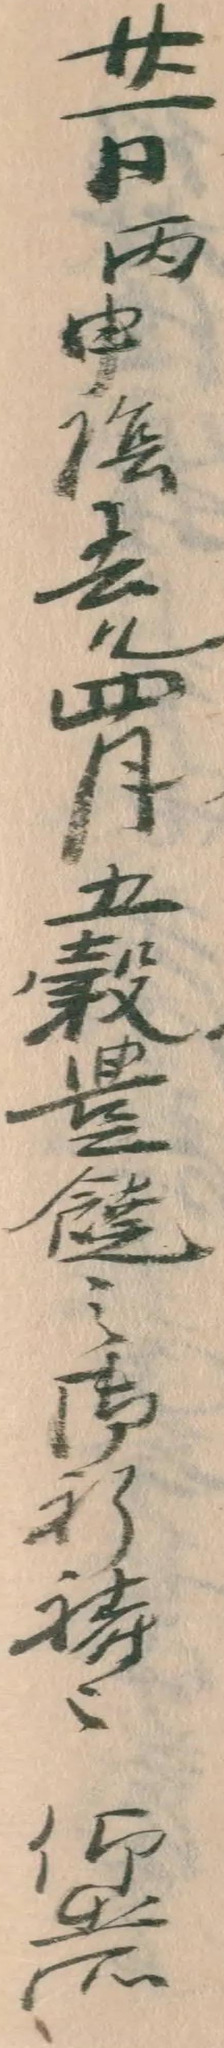廿一日丙申陰去ル四月五穀豊饒之御祈祷被仰出所
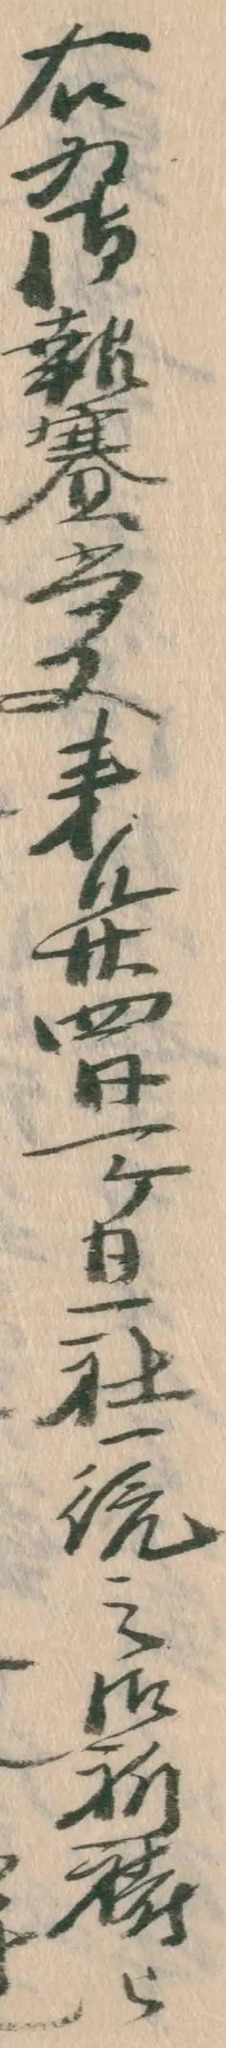右為御報賽尚又来ル廿四日一ヶ日一社一統之御祈祷被
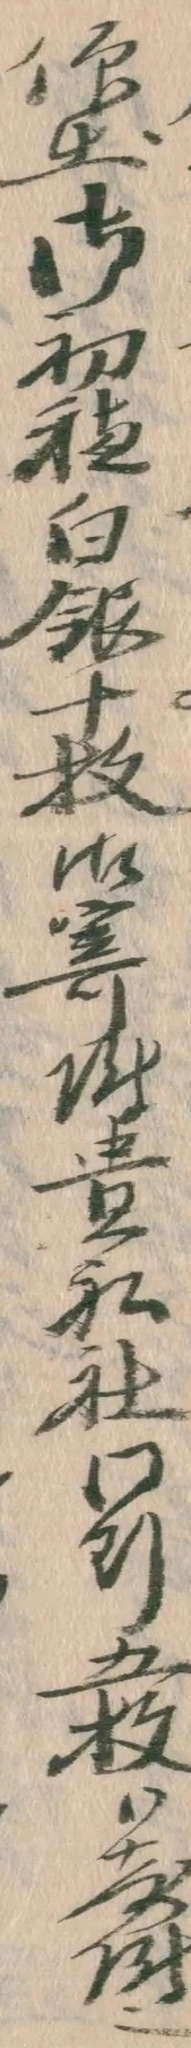仰出御初穂白銀十枚御寄附貴舩社同断五枚御寄附也
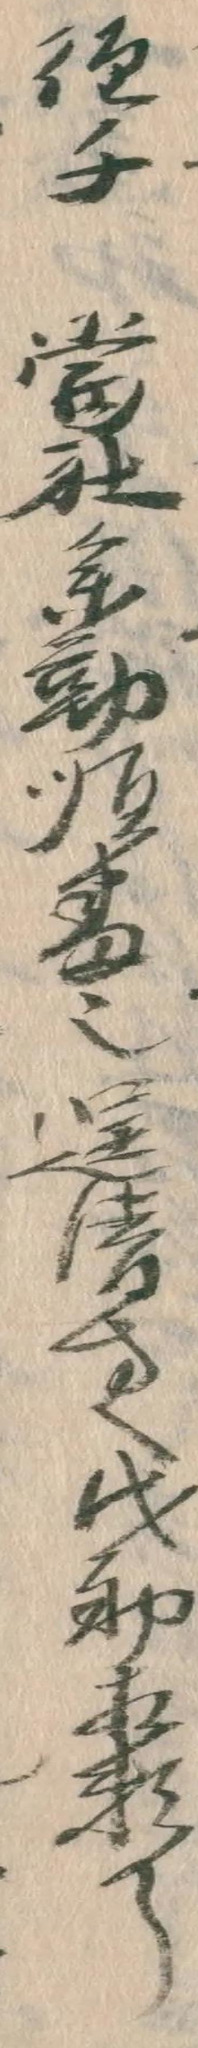経千當社参勤順番也逞清方へ代勤相頼了
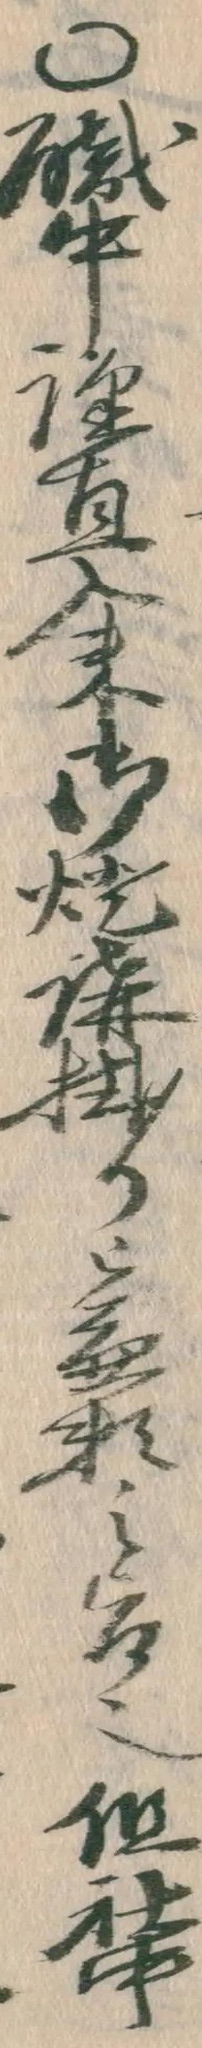○職中謹直入来御燈講掛り被兼頼之旨也但社中
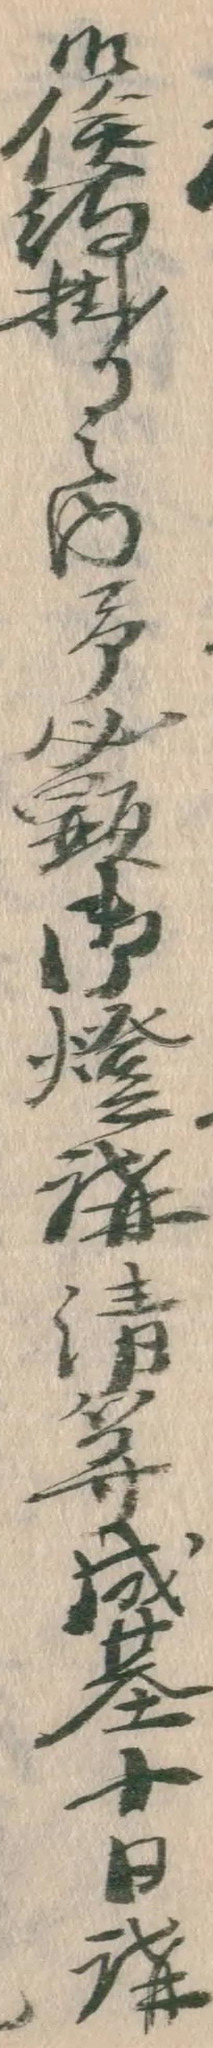御倹約掛り之内予必頸御燈講清算成基十日講
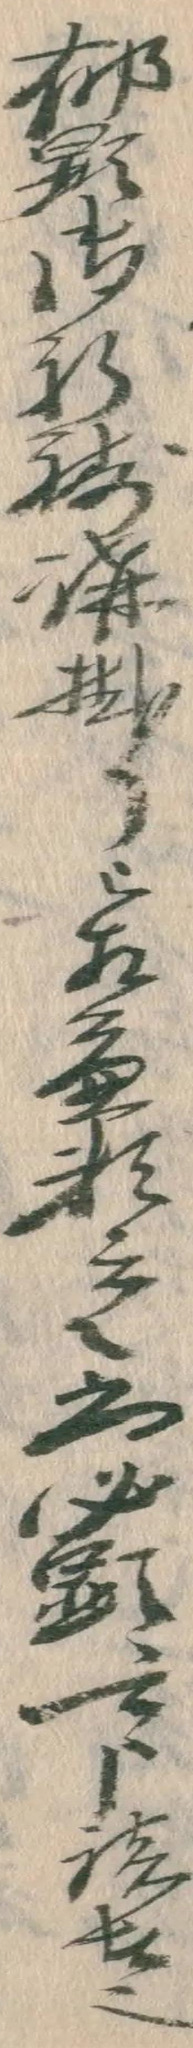郁顕御祈祷講掛り被相兼頼云々尚必顕に可申談者也
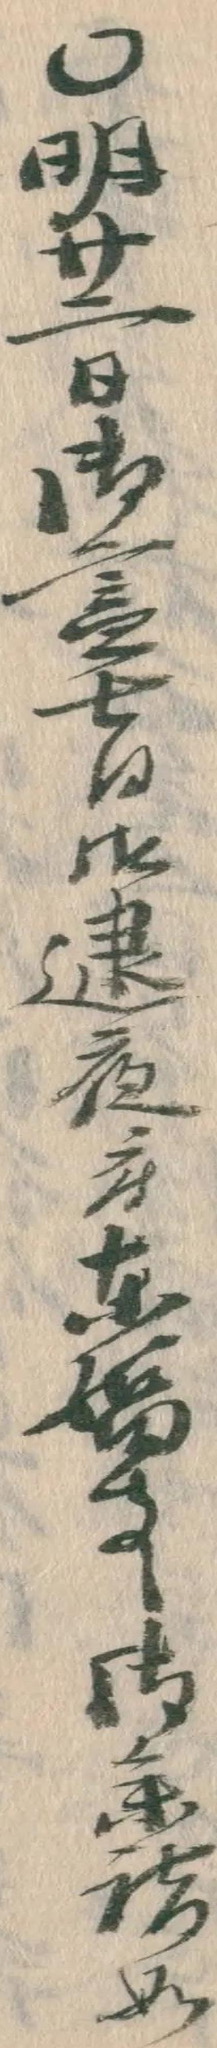○明廿二日御霊七日御逮夜二付東福寺御参詣如
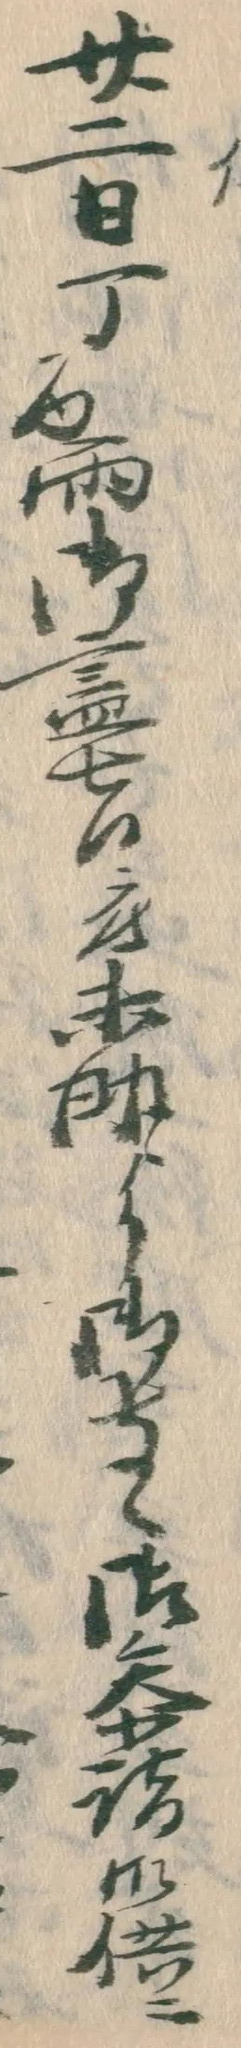廿二日丁酉雨御霊七日ニ付未明より御寺へ御参詣御供ニ
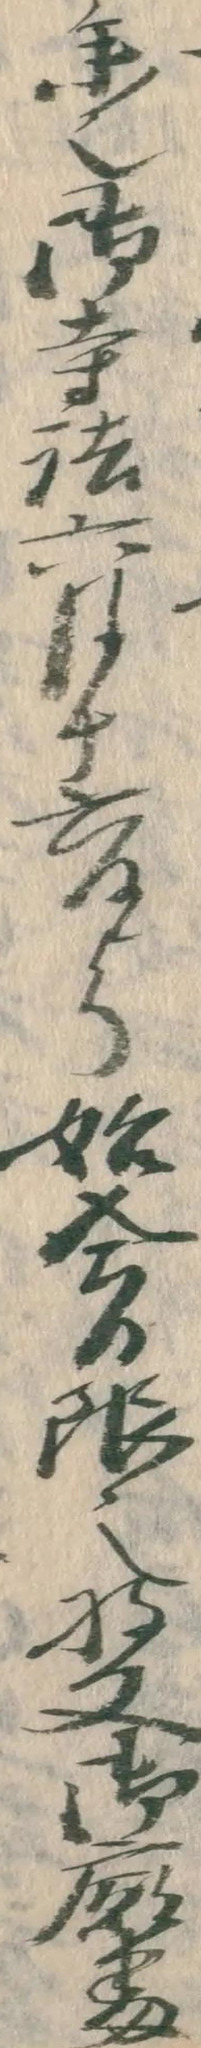参也御寺詰六月十六日より始今日限也将又御廟番
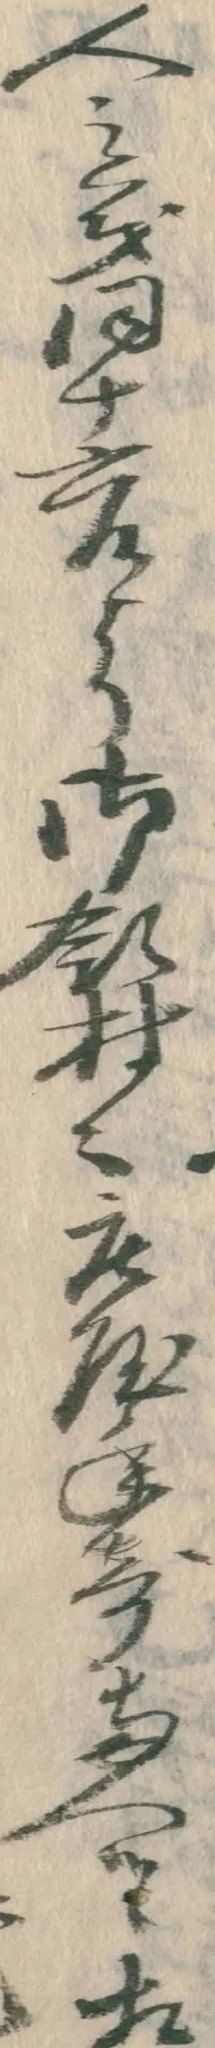人之義同十六日より御領村々庄屋年寄両人ツヽ相
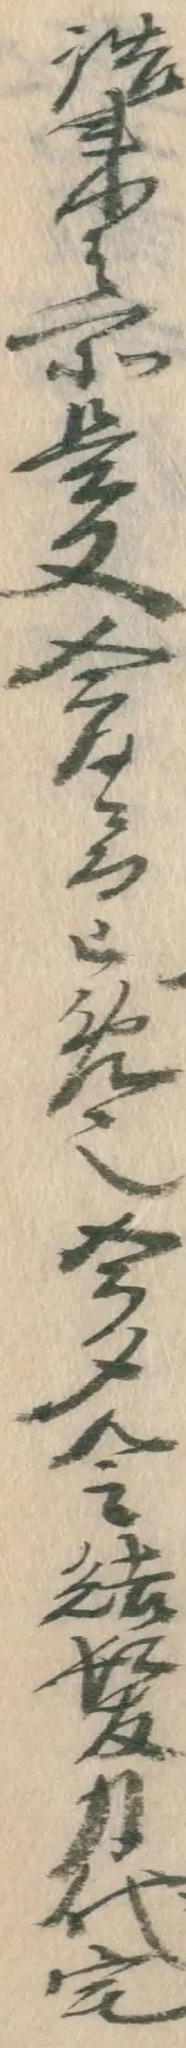詰来之所是又今日ニ而御免也今夕令結髪月代宅

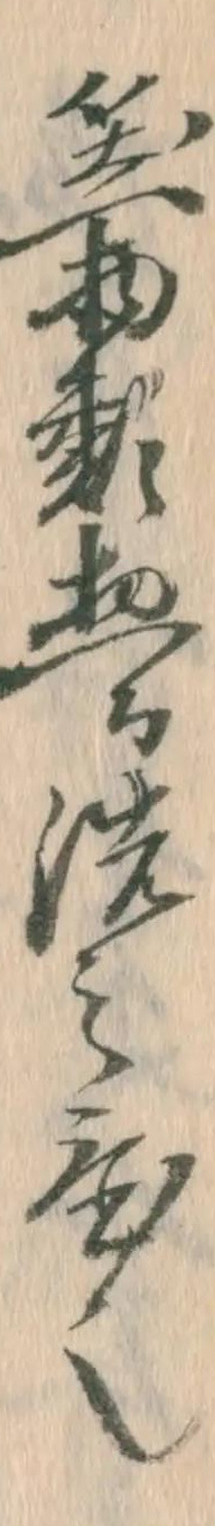蓋物類惣而洗之置也
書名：賀茂社記録. 第67冊
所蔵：国立国会図書館 National Diet Library, JAPAN
